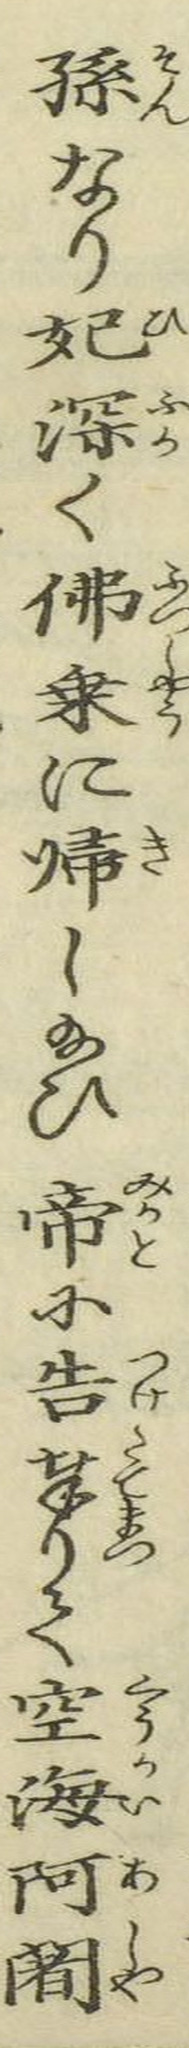孫なり妃深く佛乗に帰し給ひ帝に告奉りて空海阿闍
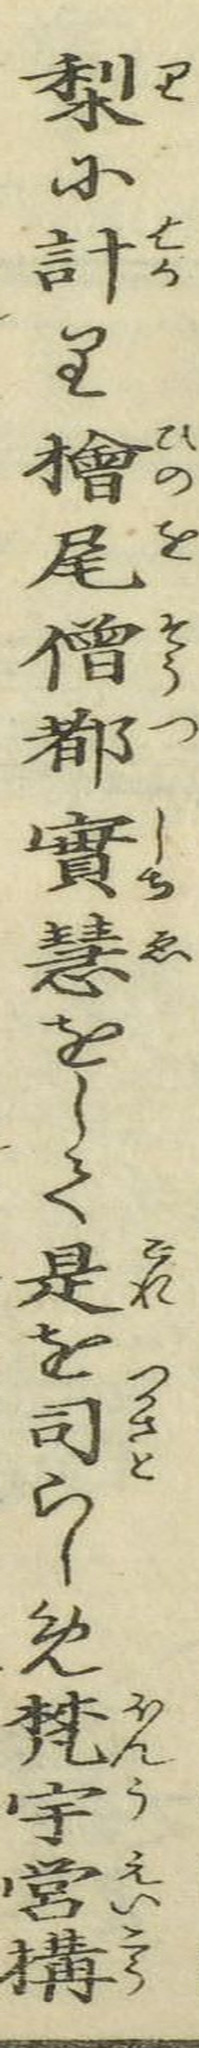梨に計り檜尾僧都實慧をして是を司らしめ梵宇営構
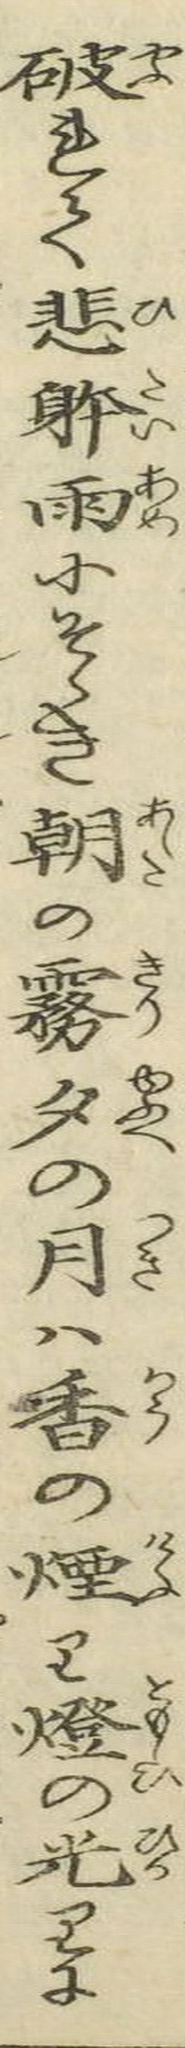破れて悲躰雨にそゝき朝の霧夕の月は香の煙り燈の光りに
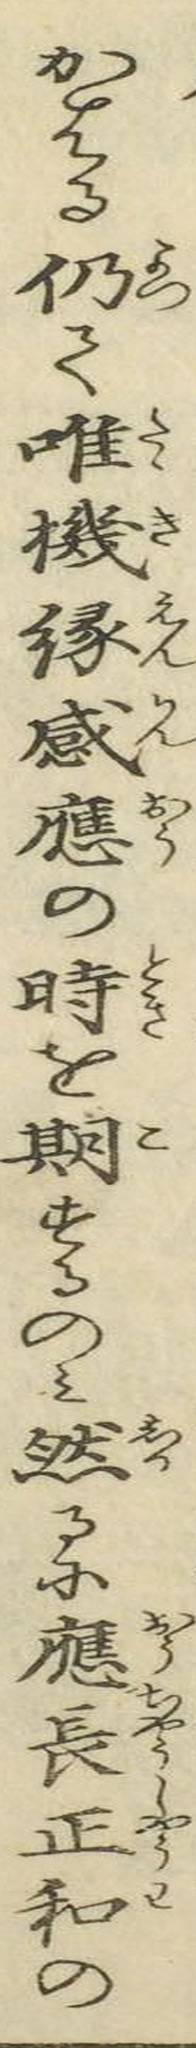かはる仍て唯機縁感應の時を期するのみ然るに應長正和の
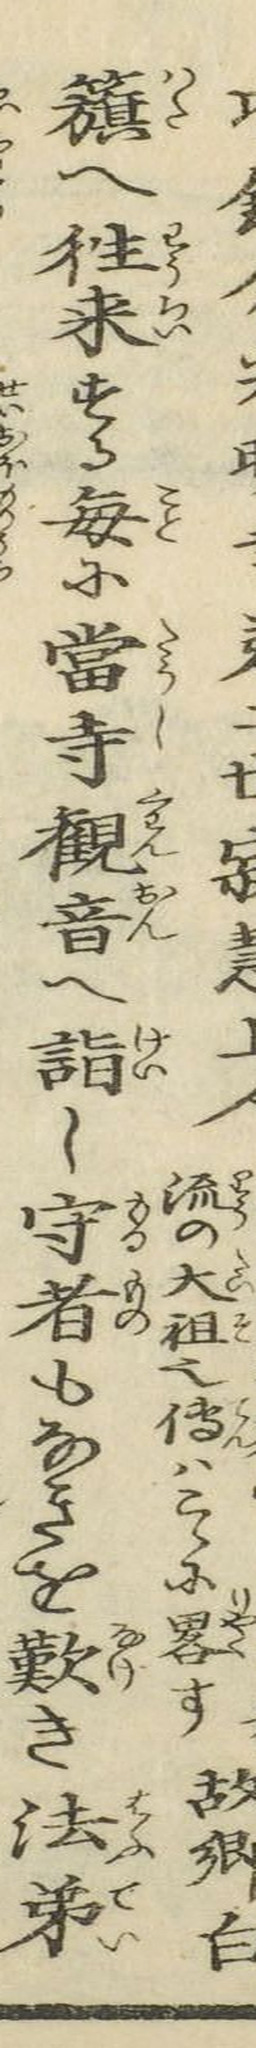籏へ往来する毎に當寺観音へ詣し守者もなきを歎き法弟
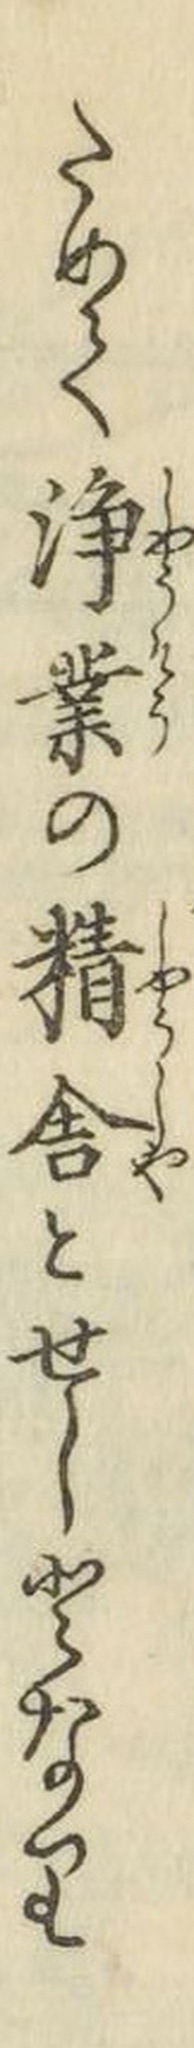ためて浄業の精舎とせしとなり
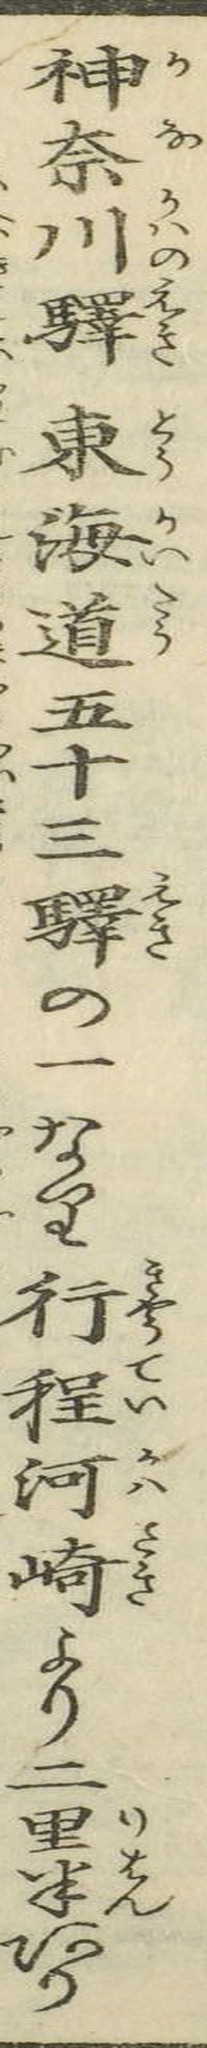神奈川驛東海道五十三驛の一なり行程河崎より二里半あり
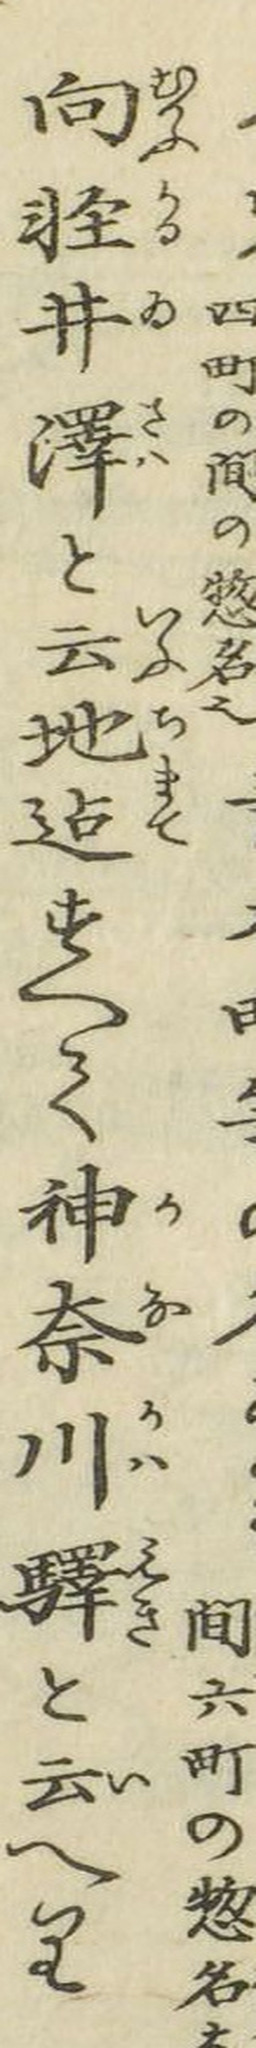向軽井澤と云地迄すへて神奈川驛と云へり
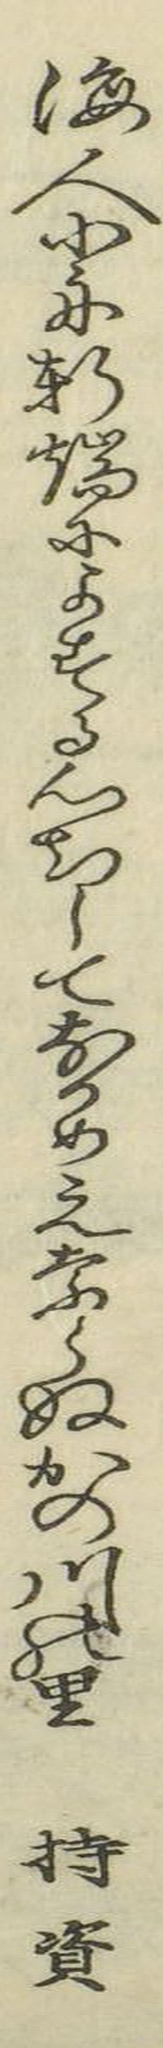海人小舟軒端によする心ちしてなかめえならぬかの川の里持資
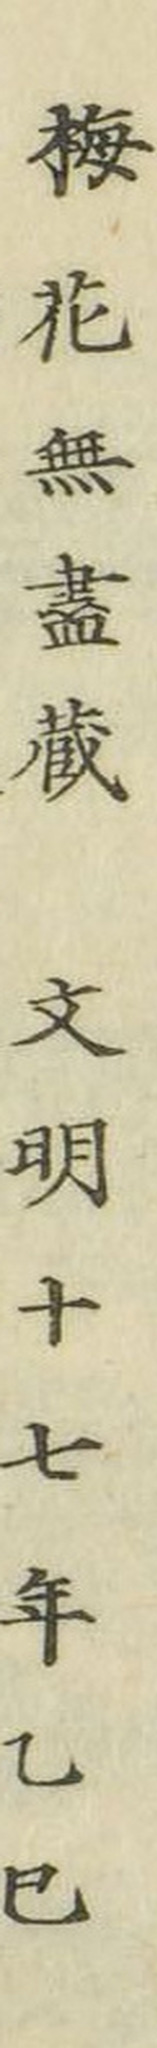梅花無盡蔵文明十七年乙巳
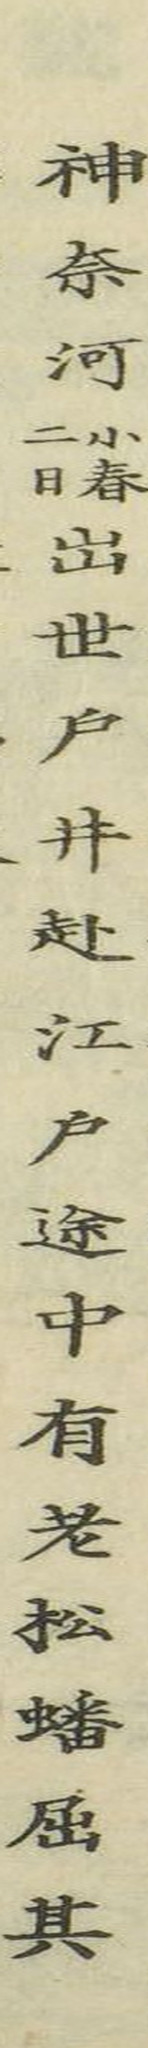神奈河小春二日出世戸井赴江戸途中有老松蟠屈其
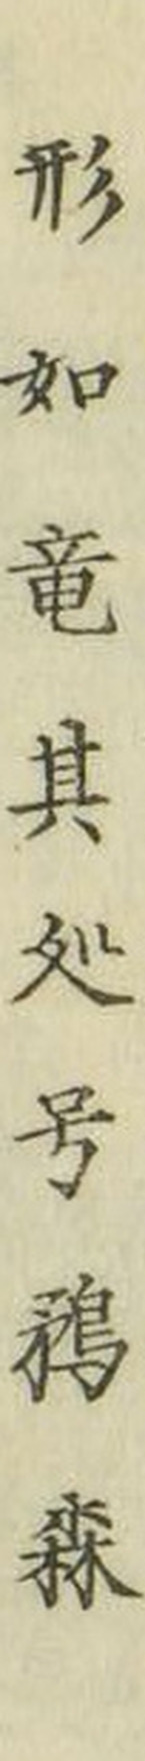形如竜其処号𩿎森
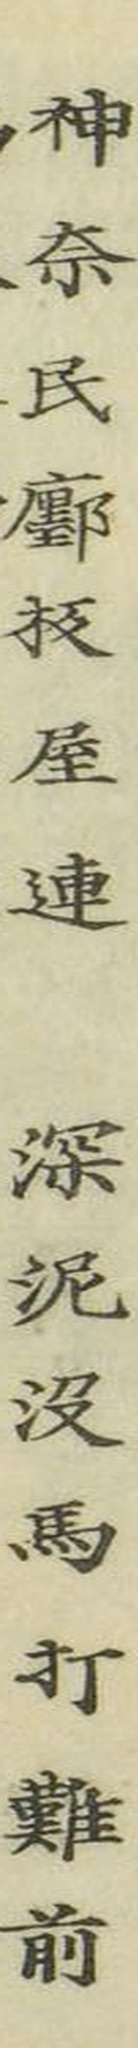神奈民鄽板屋連深泥没馬打難前
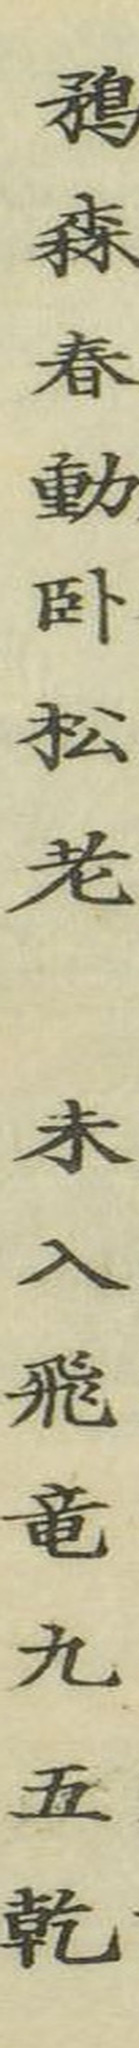𩿎森春動臥松老未入飛竜九五乾

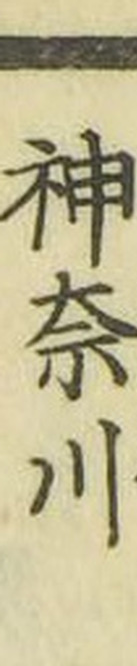神奈川
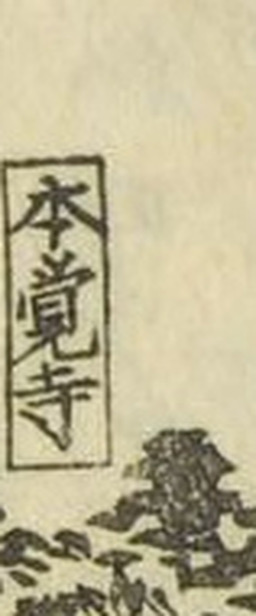本覚寺
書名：江戸名所図会 20巻 巻之5
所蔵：東京学芸大学教育コンテンツアーカイブ
